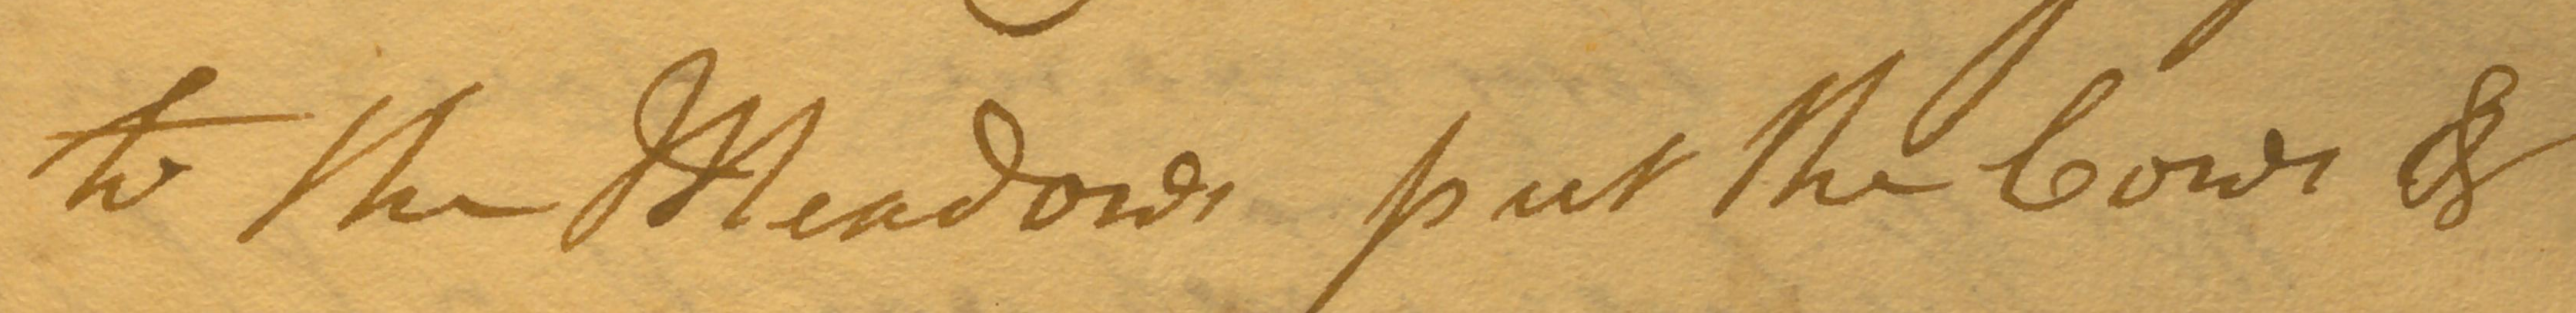to the Meadows put the Cows &
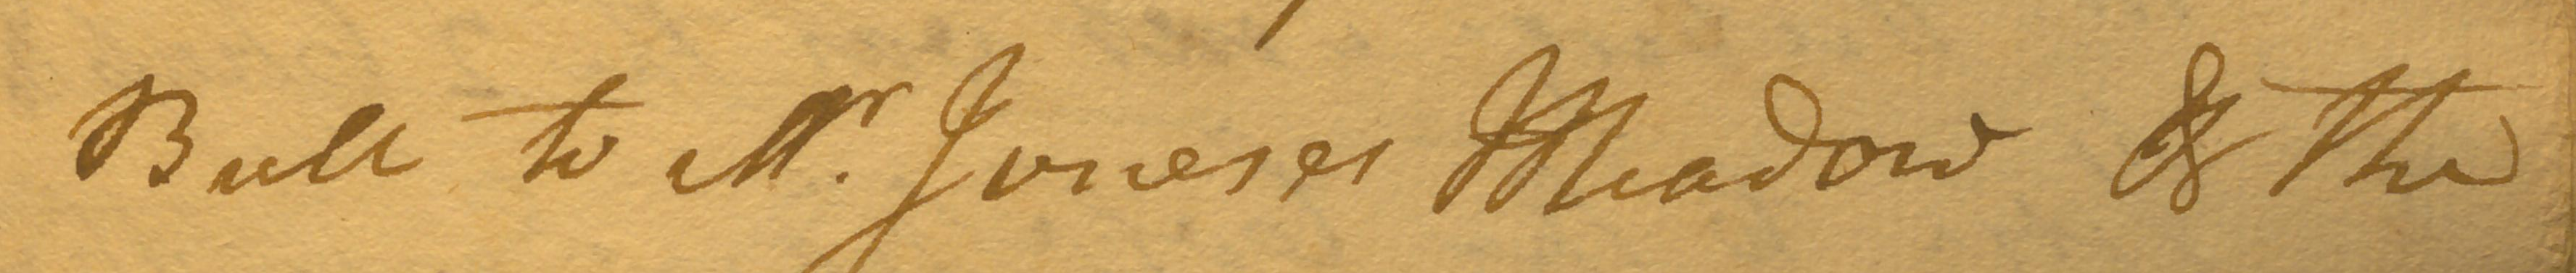Bull to M^r. Joneses Meadow & the
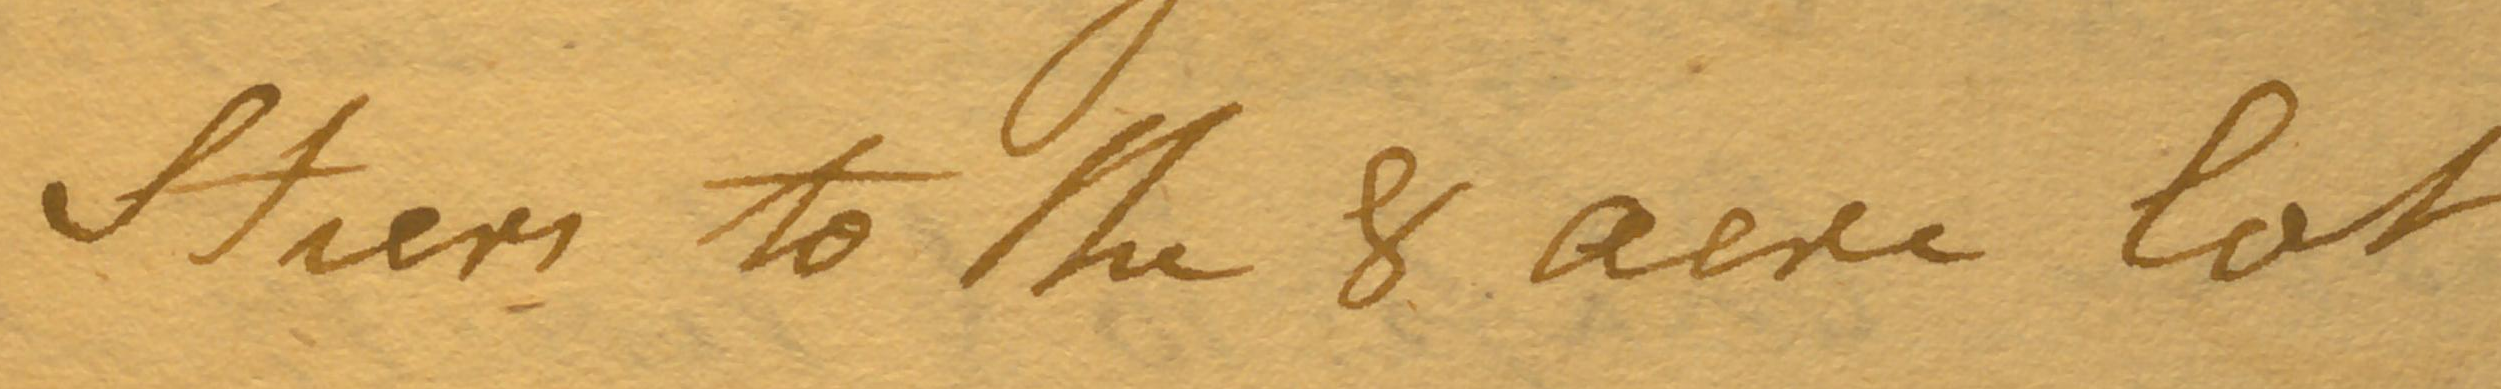Steers to the & acre lot
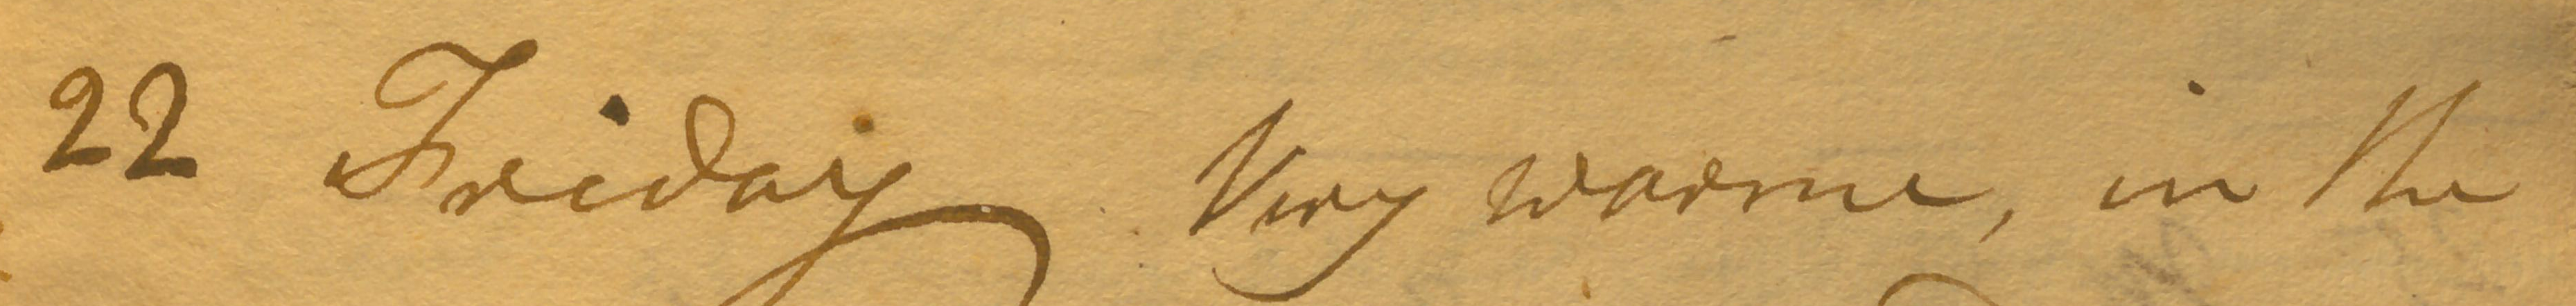22 Friday Very warme, in the
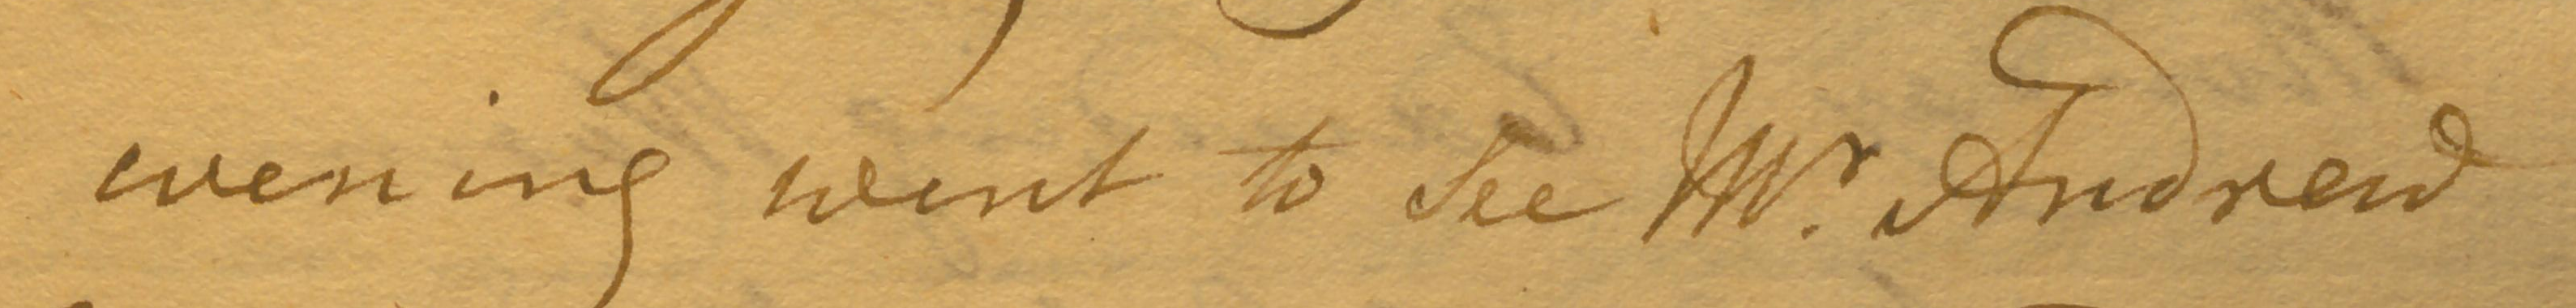evening went to see M^r. Andrew
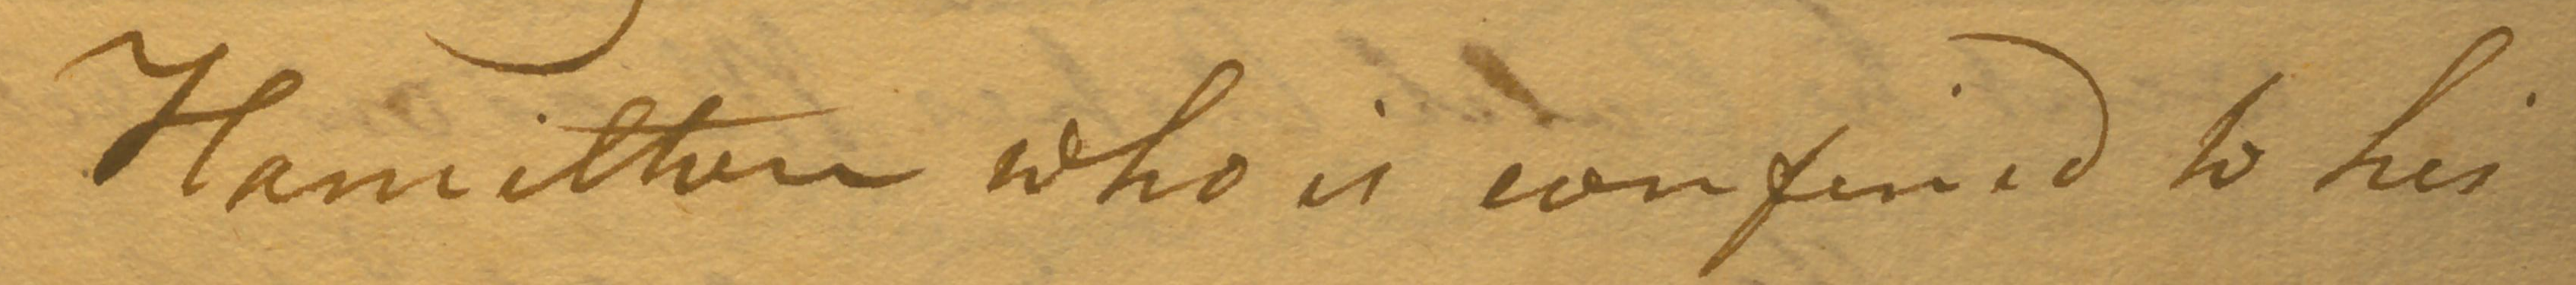Hamilton who is confined to his
